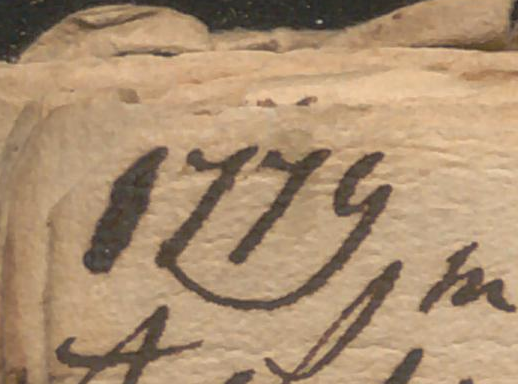1779
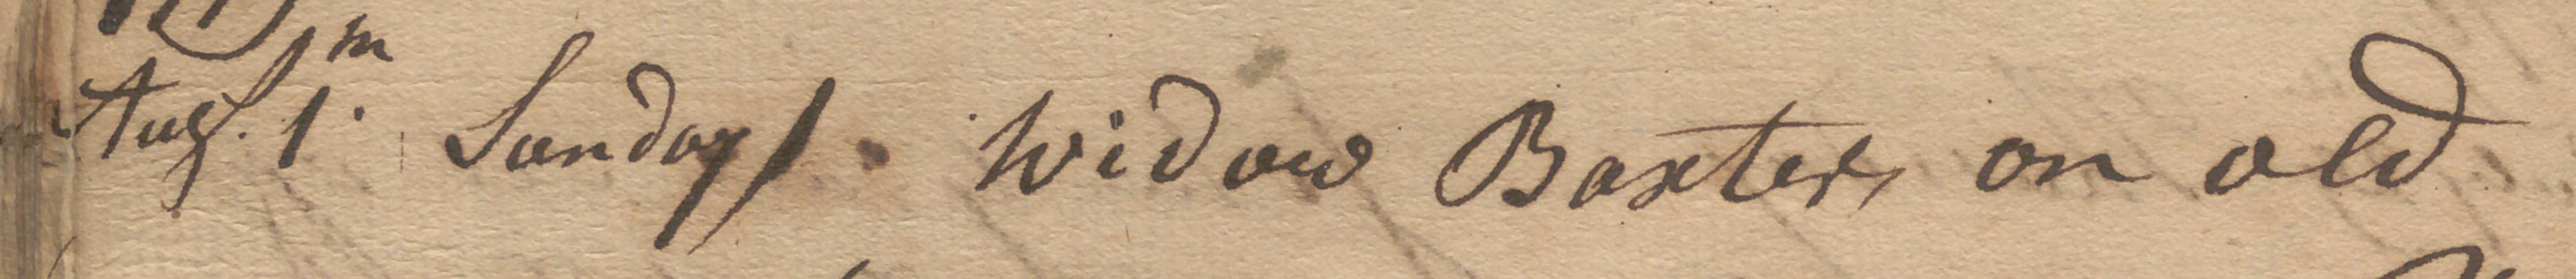Aug^t. 1^th. Sunday / Widow Baxter, on old
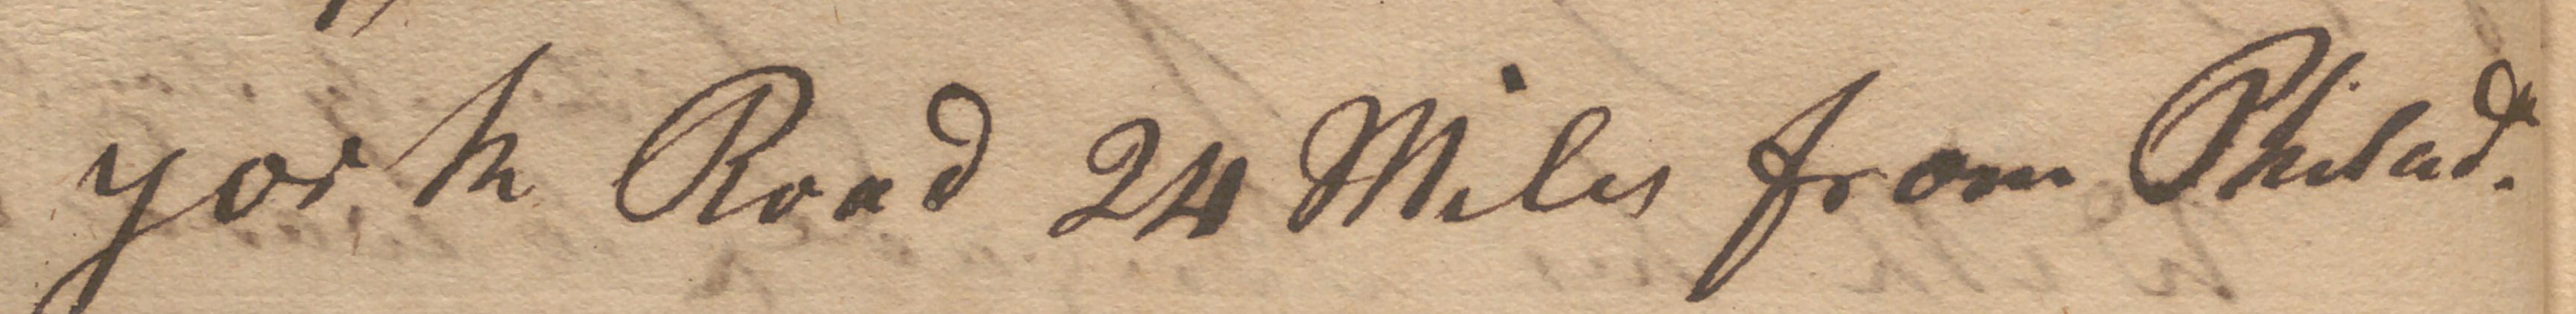york Road 24 Miles from Philad^a.
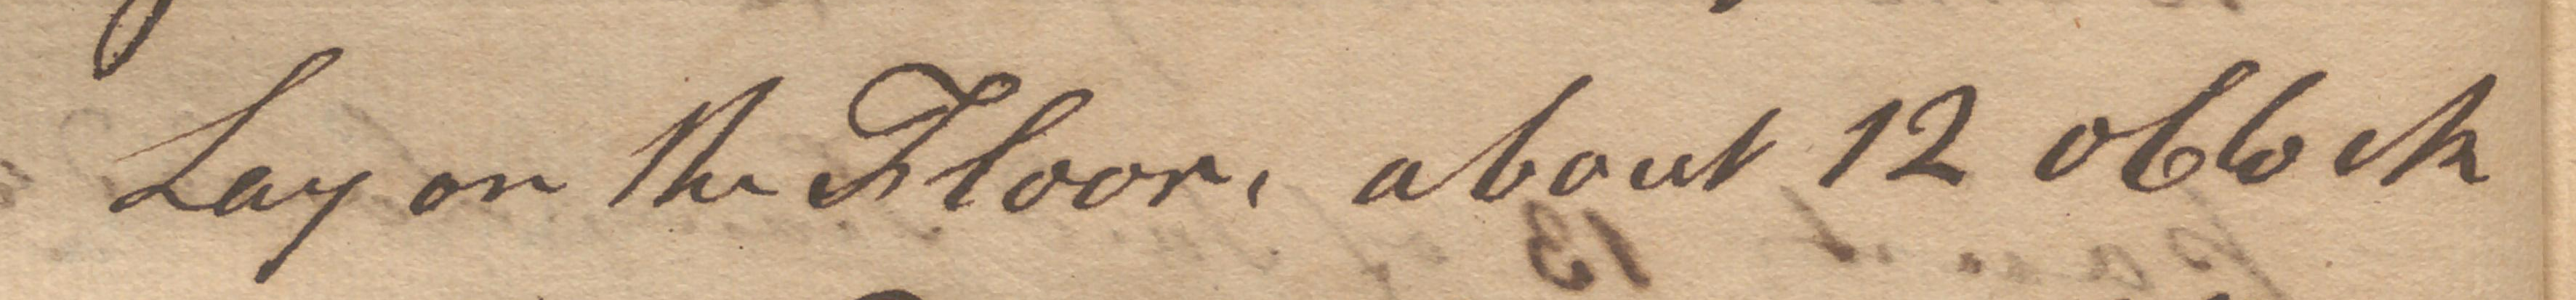Lay on the Floor, about 12 oClock
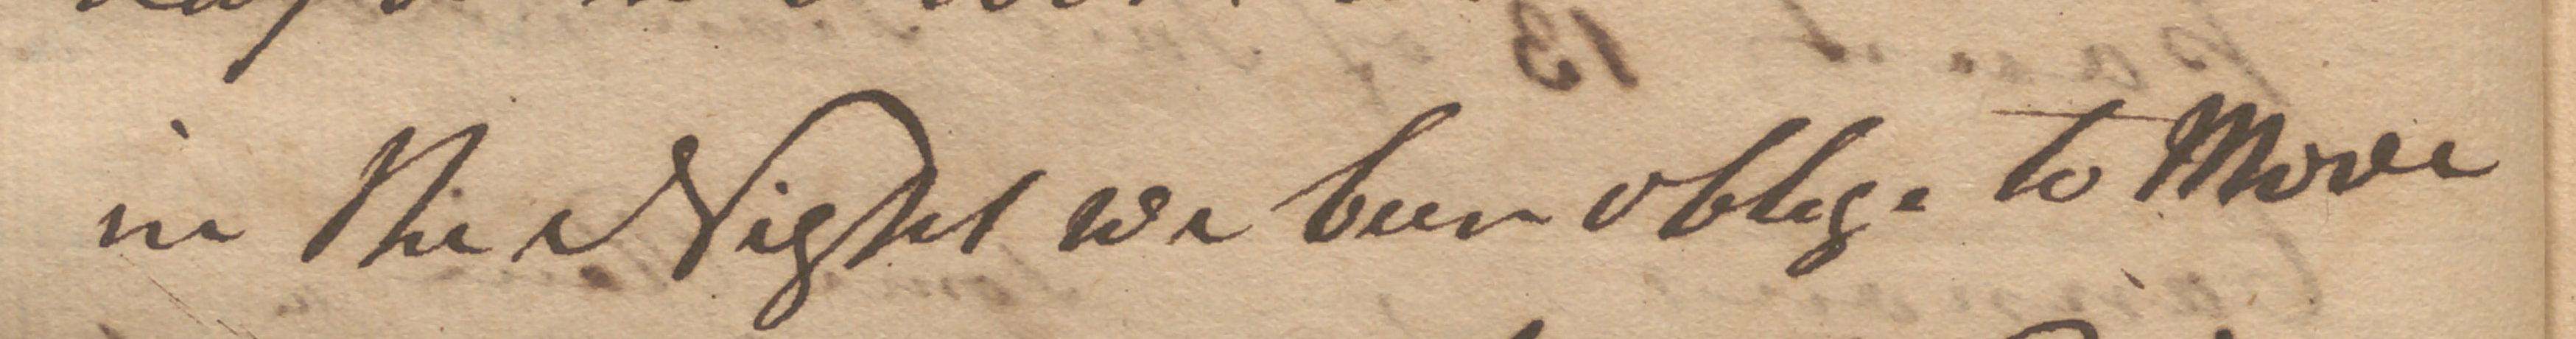in the Night we been oblige to Move
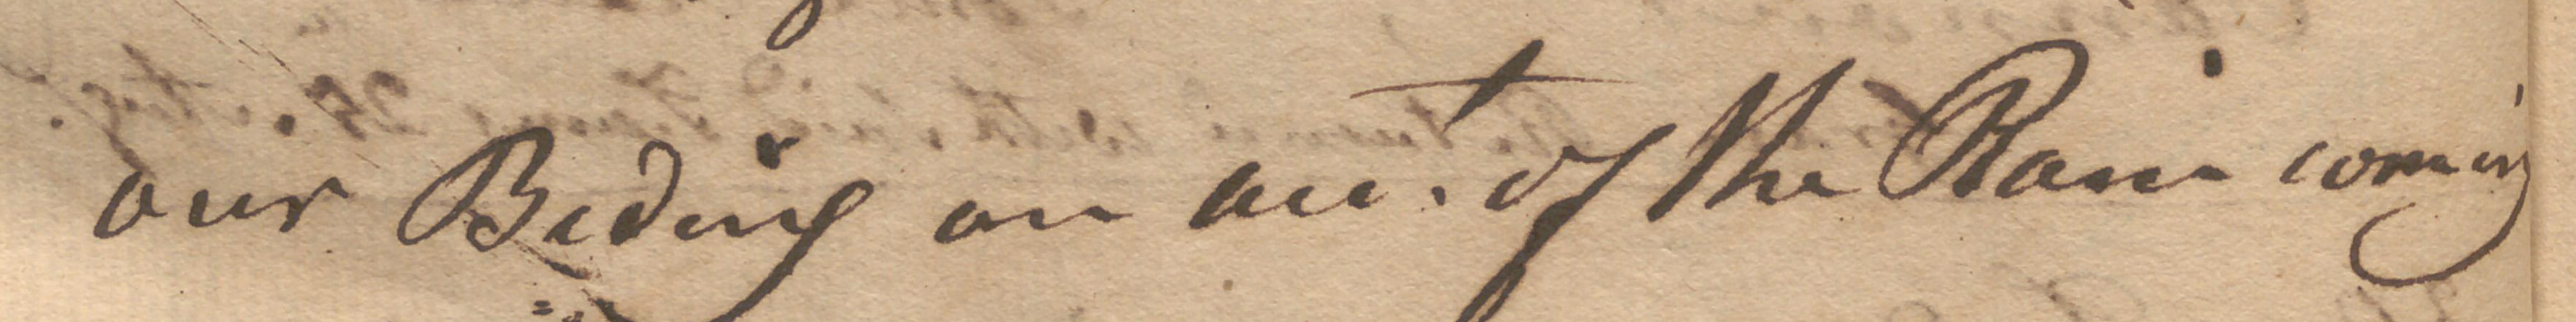our Beding on acc^t. of the Rain coming
